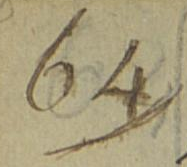64
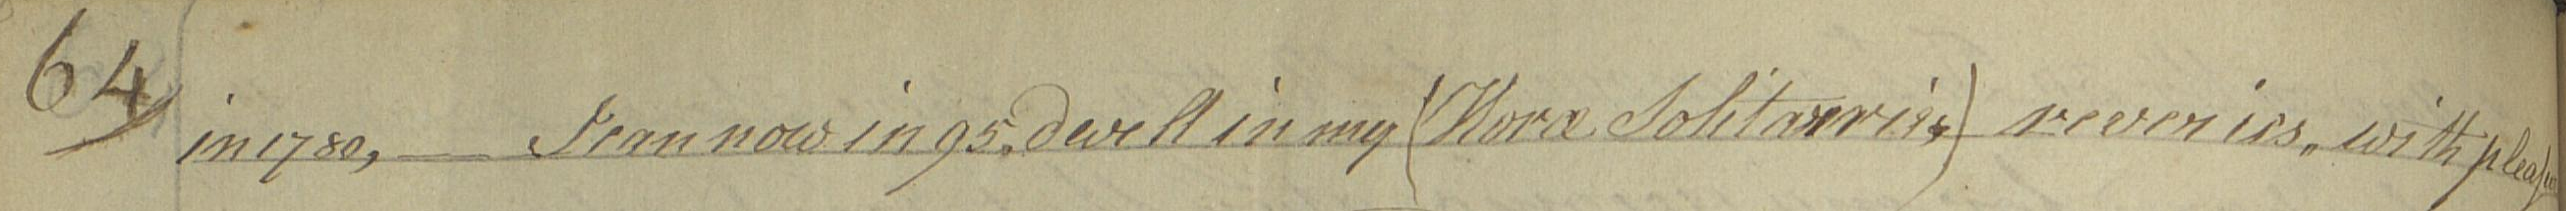in 1780, I can now in 95, dwell in my (Hora Solitarri) reveries, with pleas-
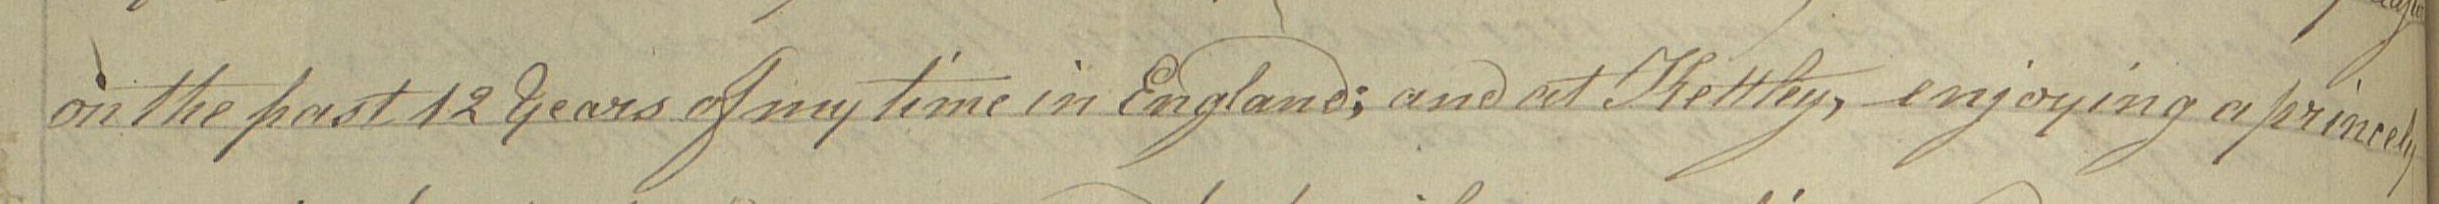on the past 12 Years of my time in England: and at Hettley, enjoying a princely
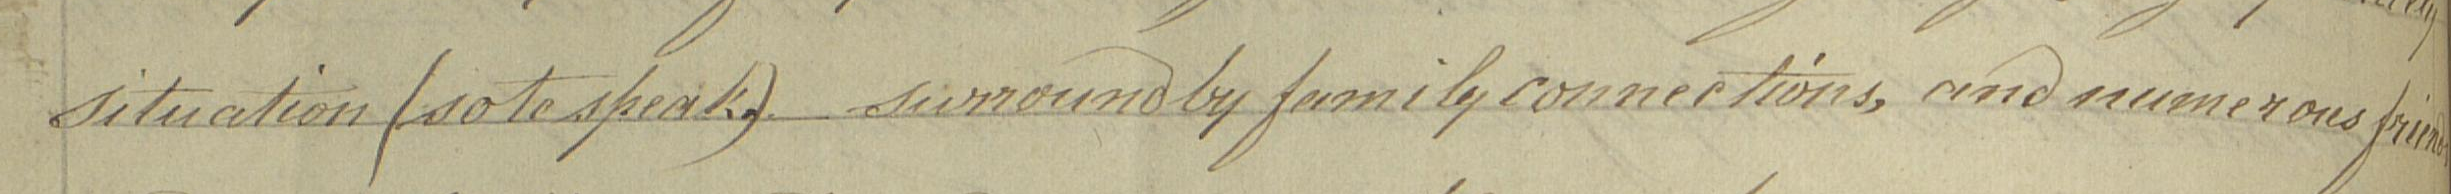situation (so to speak) surround by fumily connections, and numerous fr-
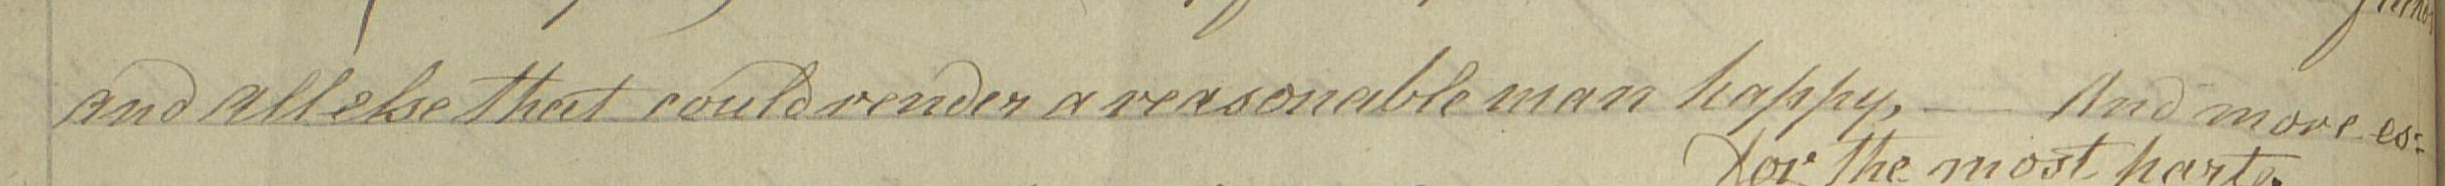and all else that could render a reasonable man happy, And more es-
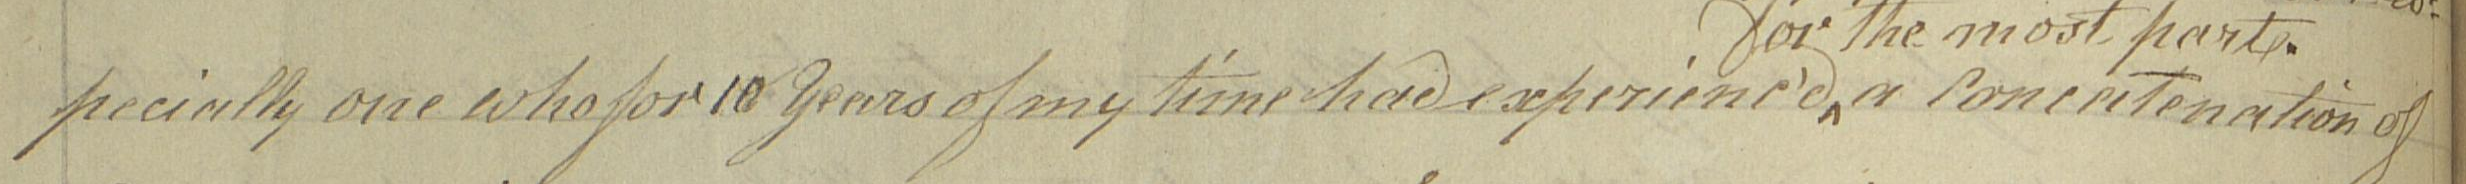-pecially one who for 10 years of my time had experienc'd,^ a concatenation of
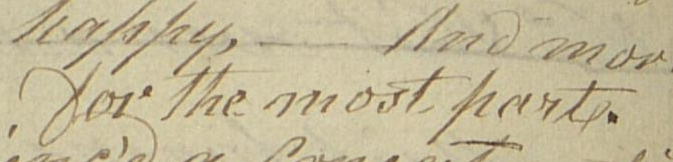for the most part
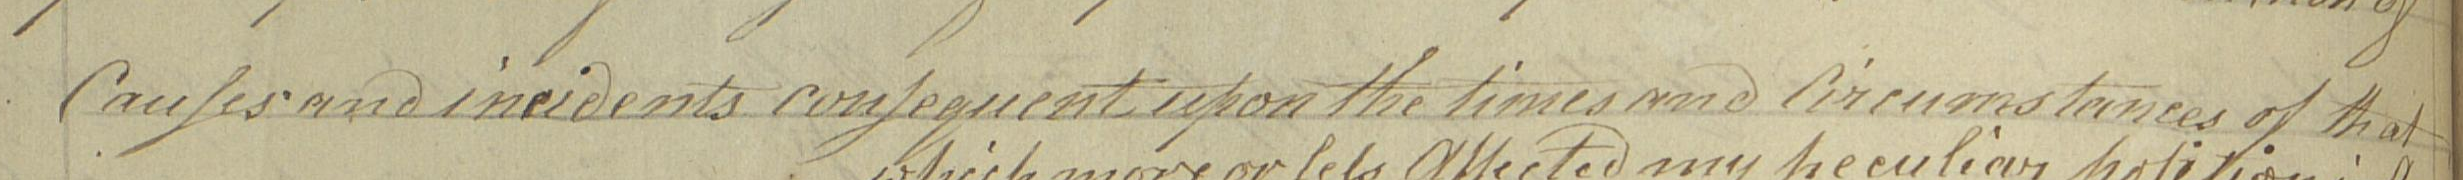Causes and incidents consequent upon the times and Circumstances of that
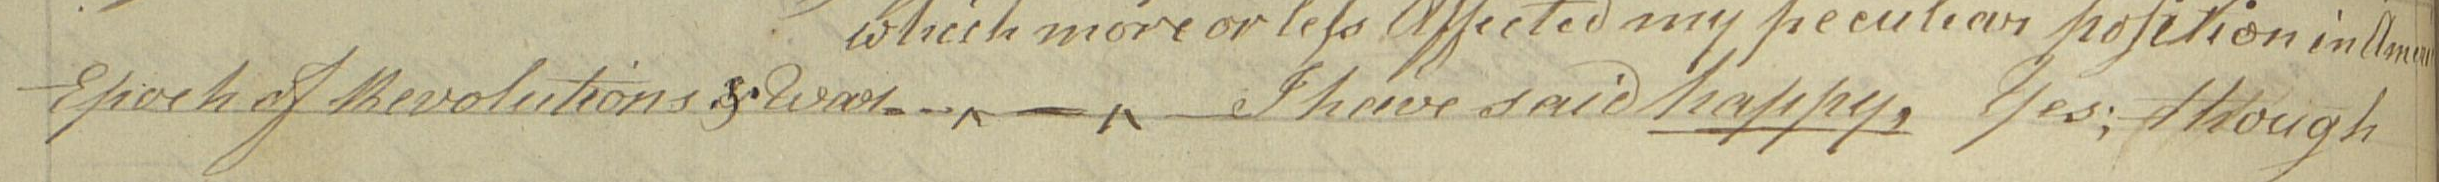Epoch of the volutions & Wool ^ ^ I have said happy, Yes; though
